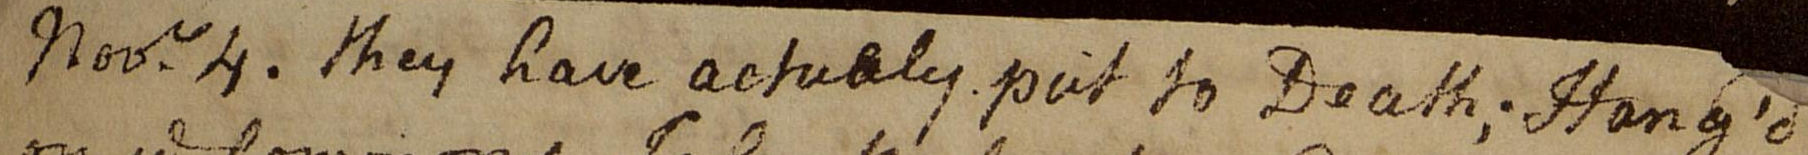Nov^r. 4. They have actualy put to Death; Hang'd
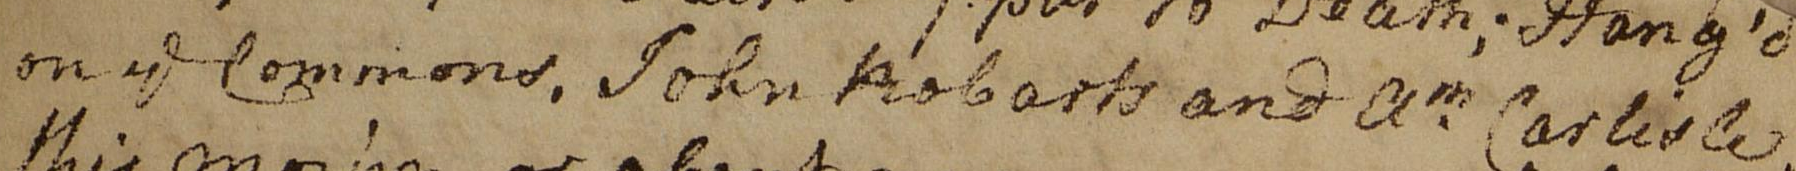on y^e Commons, John Roberts and A^m. Carlisle,
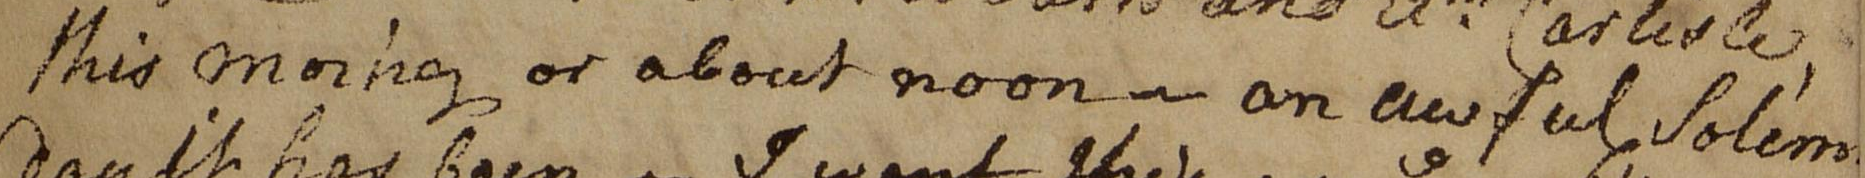This morn'g or about noon- an awful solem
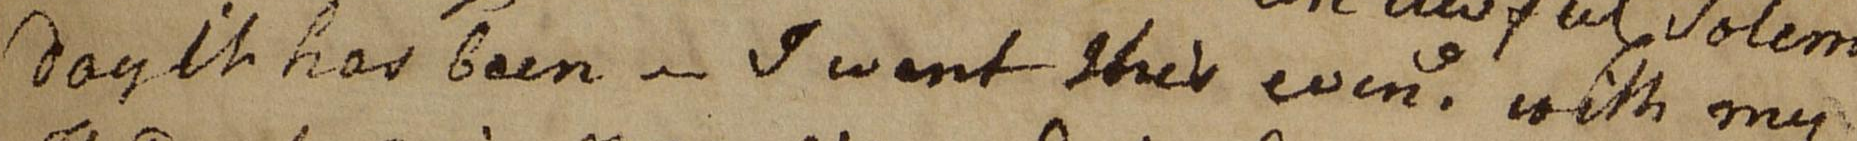day it has been- I went this even^g. with my
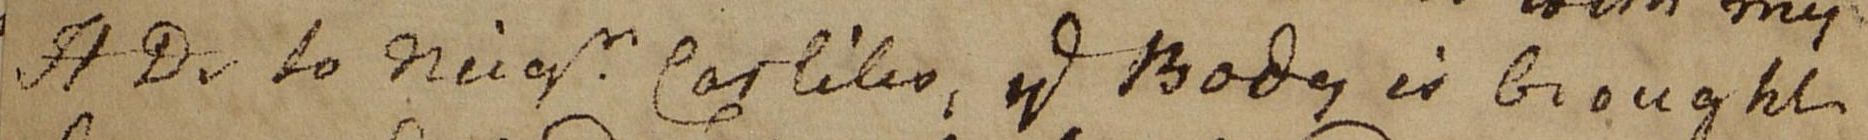HD. to Neig^r. Carliles, y^e Body is brought
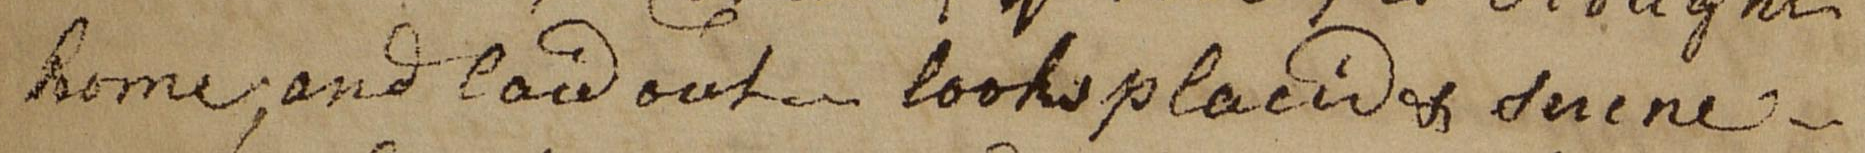home; and laid out- looks placid & serene-
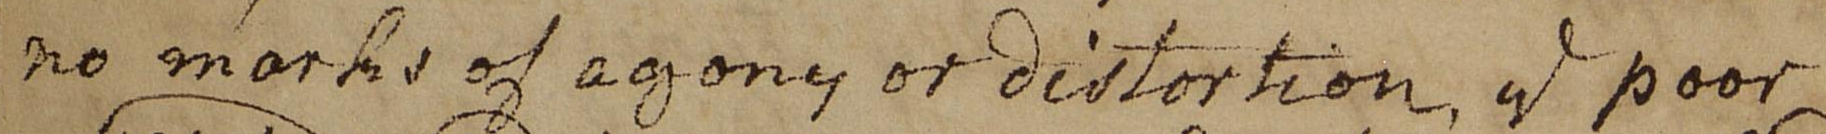no marks of agony or distortion, y^e poor
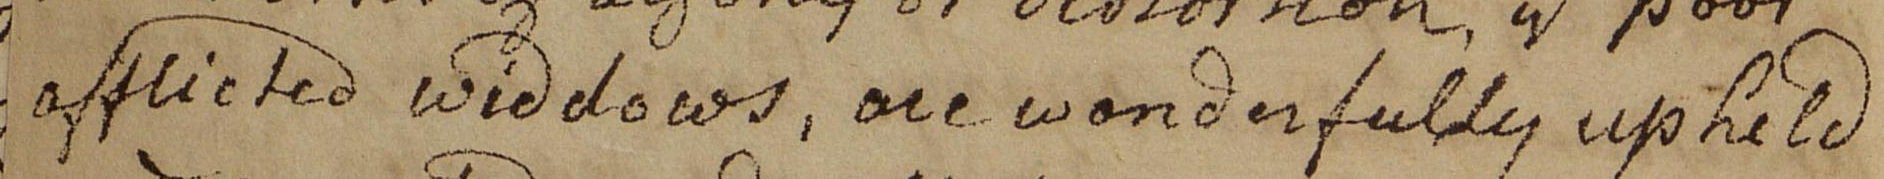afflicted widdows, are wonderfully upheld
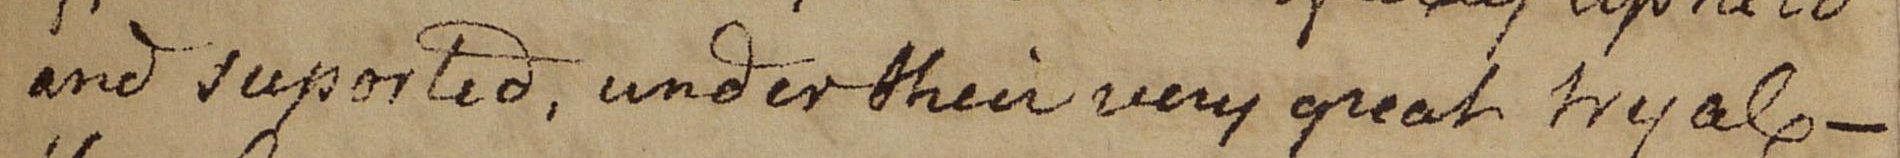and suported, under their very great tryal-
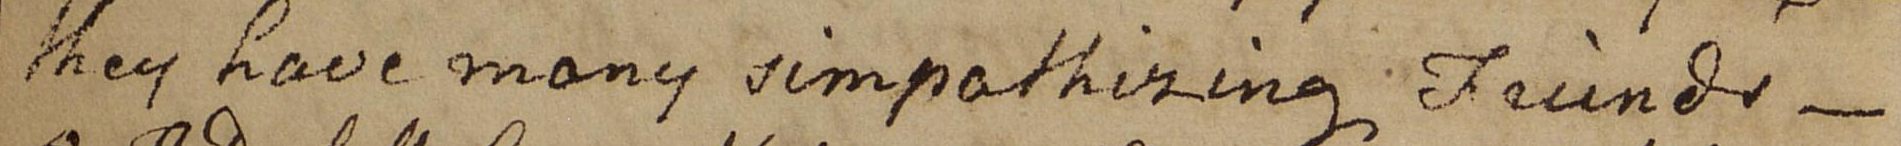they have many simpathizing Friends-
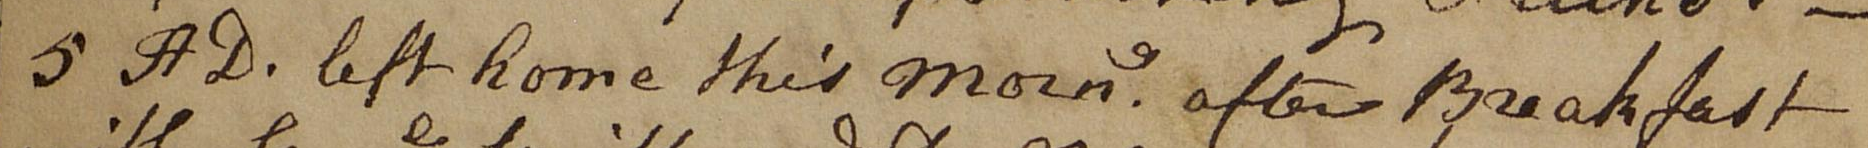5 HD. left home this morn^g. after Breakfast
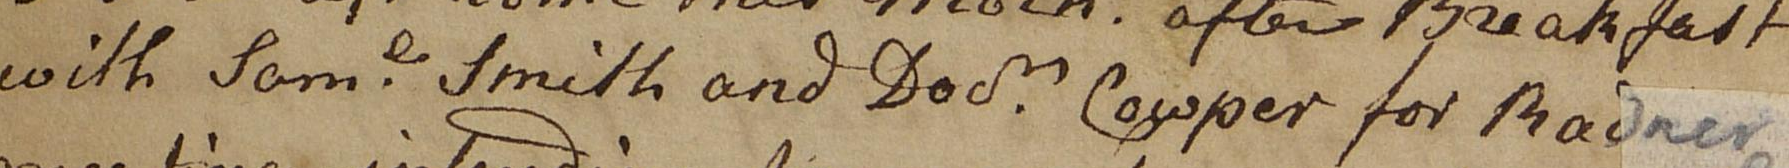with Sam^l. Smith and Doc^r. Cowper for Radner
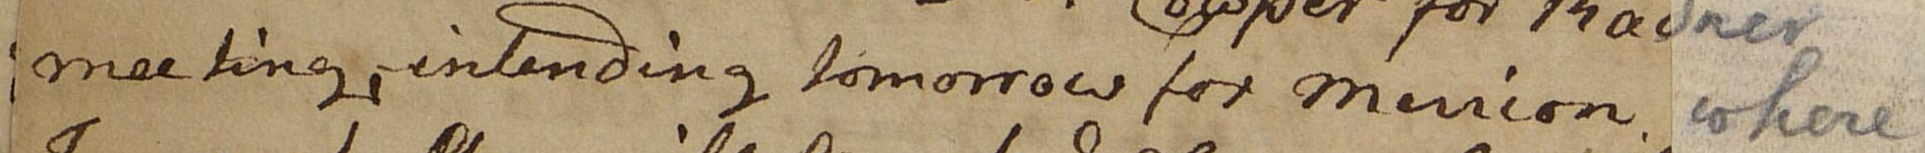meeting, intending tomorrow for merrion, where
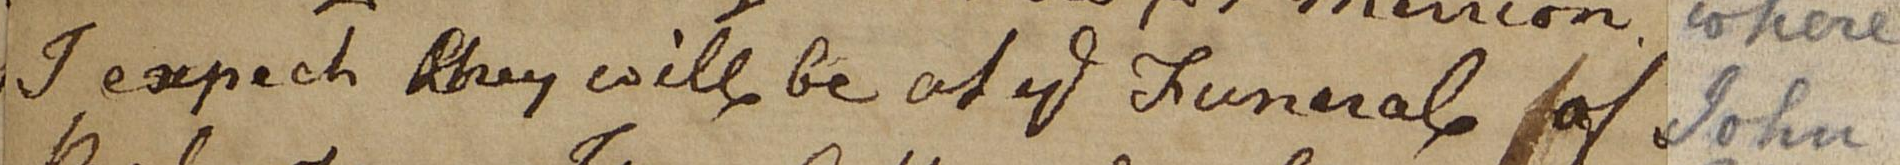I expect they will be at y^e Funeral of John
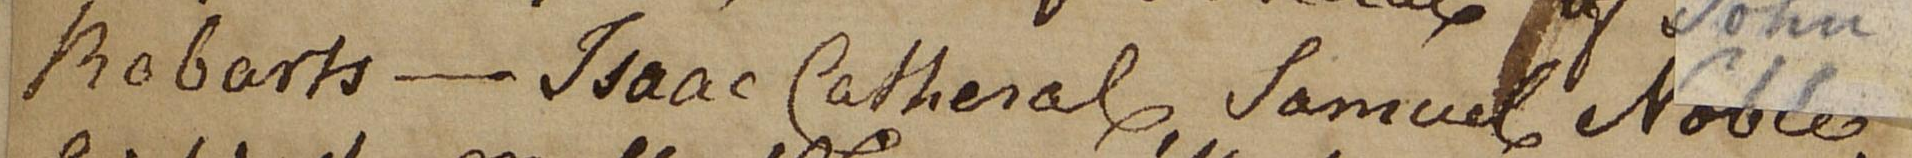Robarts- Isaac Catheral Samuel Noble,
